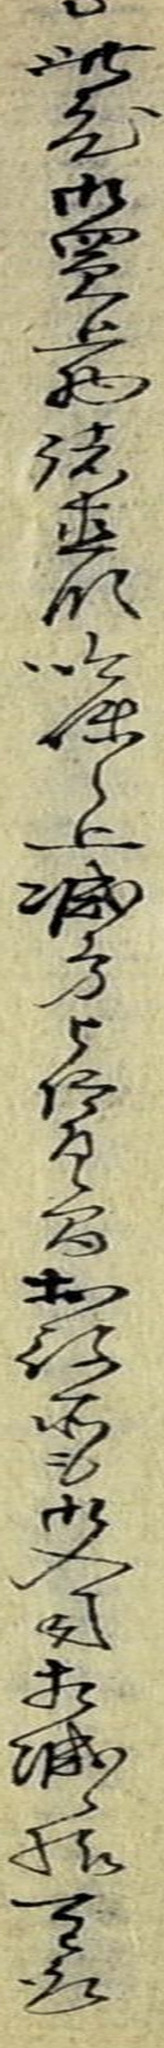○此度御買上物諸直段吟味之上減方被仰付候間於役所も御入用相減候様可被取
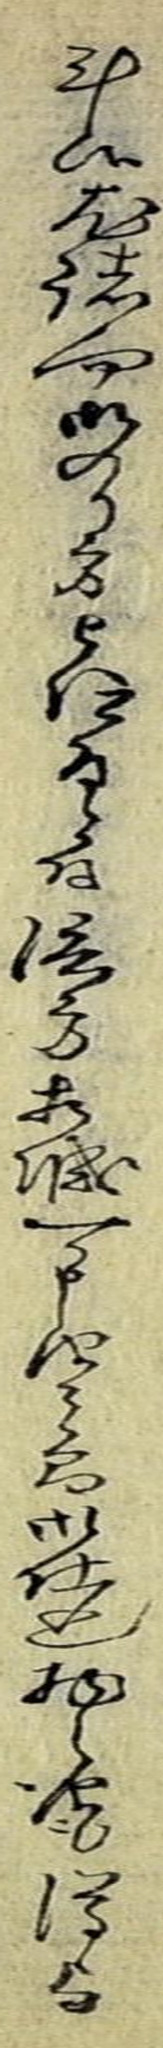斗候尤諸向御〆り方被仰付候に付渡方相減可申儀に候間御仕込物之儀も得と
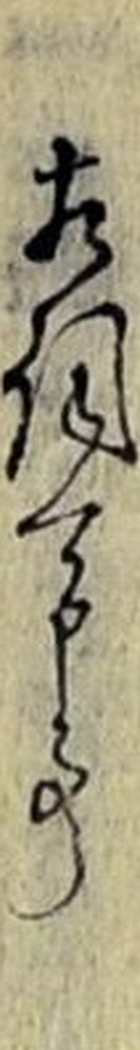相伺可申事
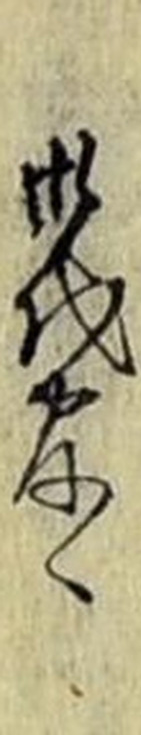御代官へ
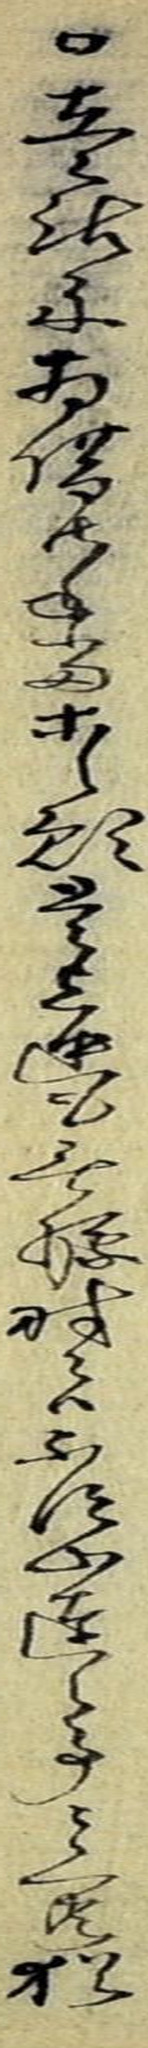○在々銀米拝借共手当等之願是迄迚も無拠村々に而は不得止達候事に候へ共猶
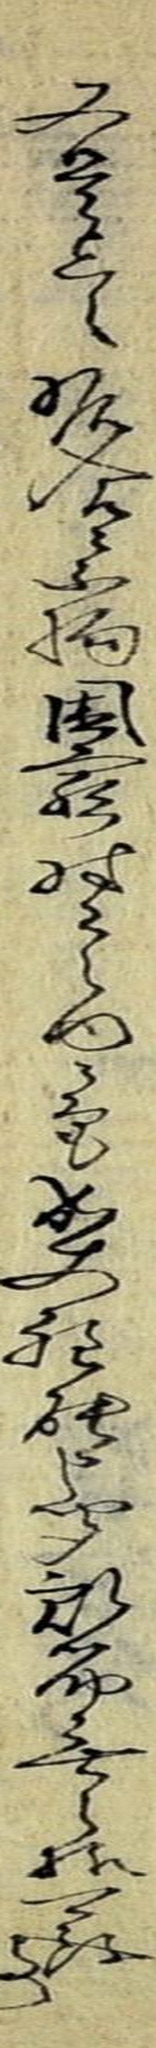又是迄之振合に不拘困窮村々之内に而も成丈程能申聞願筋無之様可致事
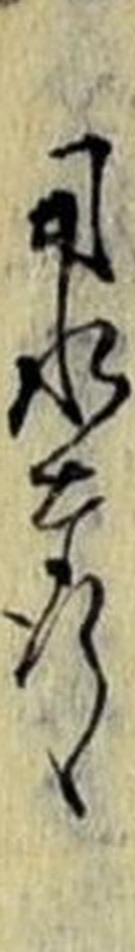用水奉行へ
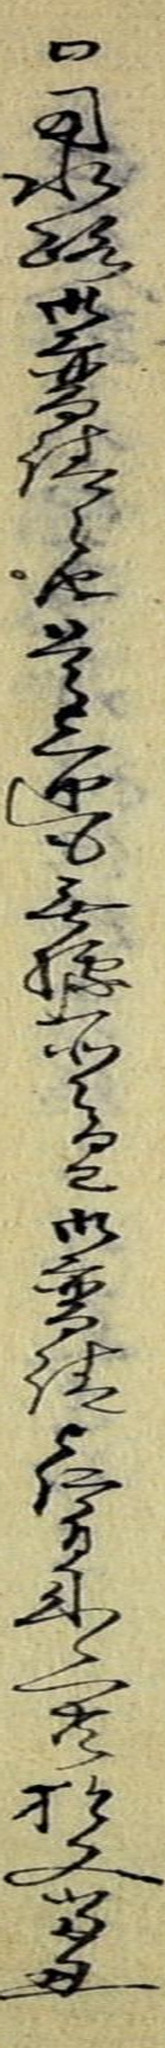○用水路御普請之儀是迄迚も無拠所々而己御普請被仰付来候へ共猶又当丑
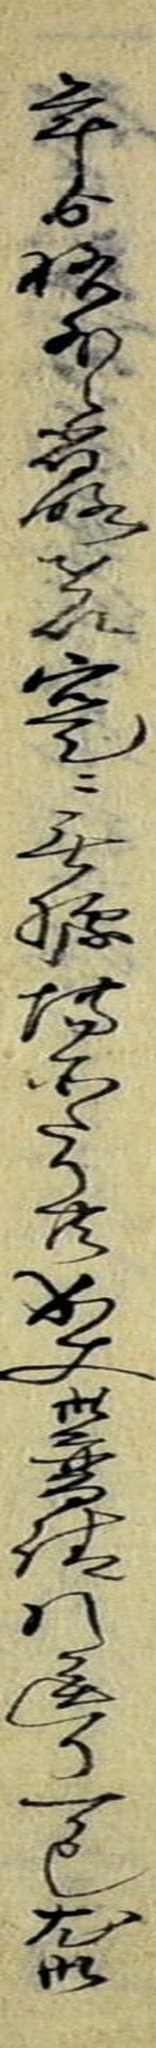年ゟ格外之省略を以寔に無拠場所たり共成丈御普請引送り可申候尤御
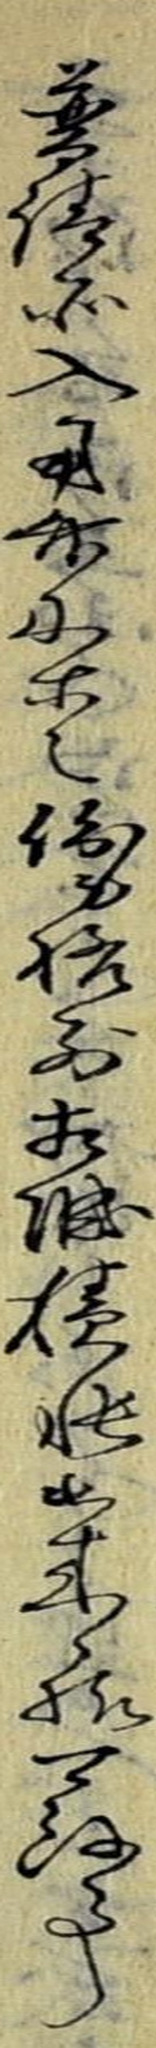普請所入用竹木等之儀も格別相減積帳出来候様可致事
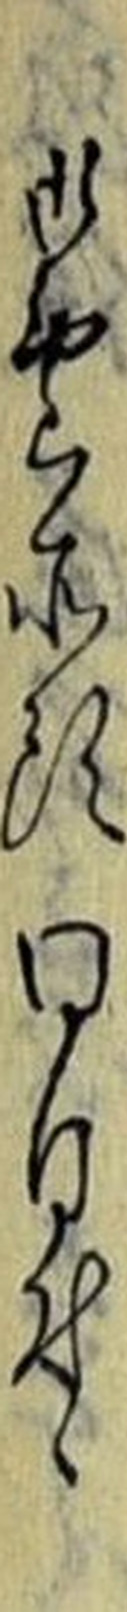御台所頭同目付へ
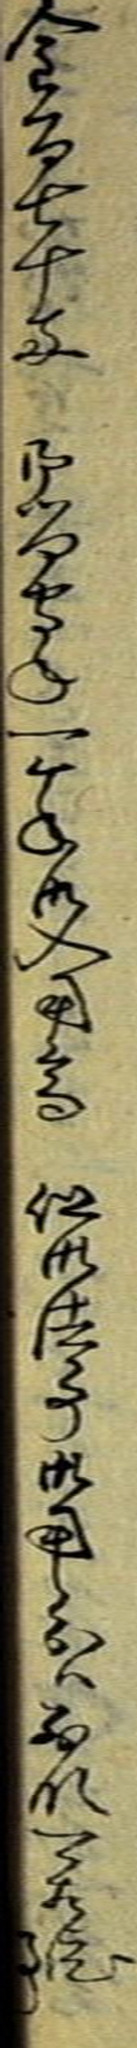一金百七十両御留守年一ヶ年御入用高但御法事御用之分は別段可相渡事
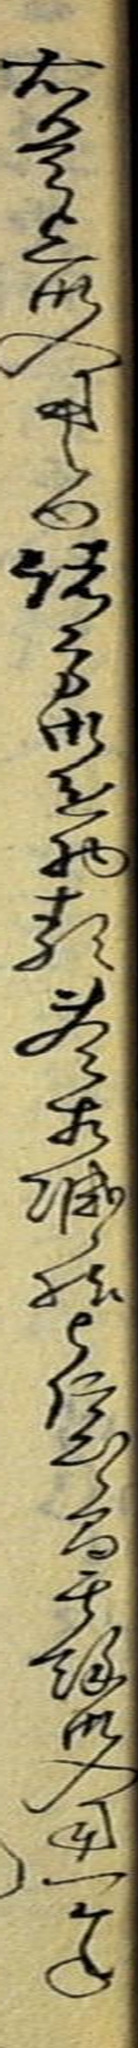右是迄御入用之内諸方御進物類夫々相減候様被仰出候間其餘御入用一ヶ年
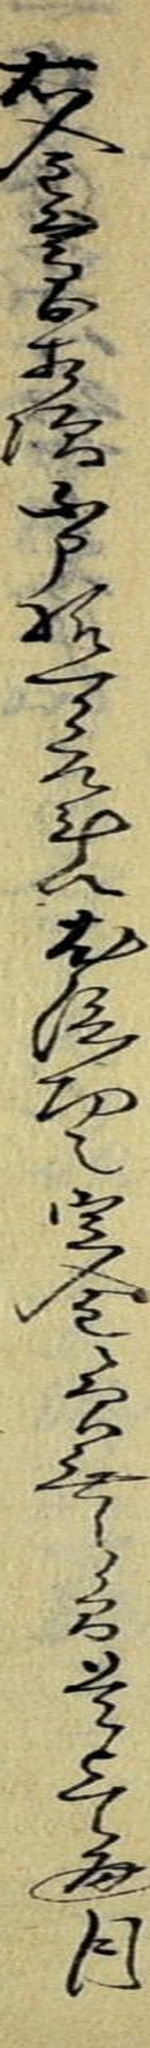右金高ゟ相増不申様可被取斗候尤渡切之定金に而は無之候間是迄之通月
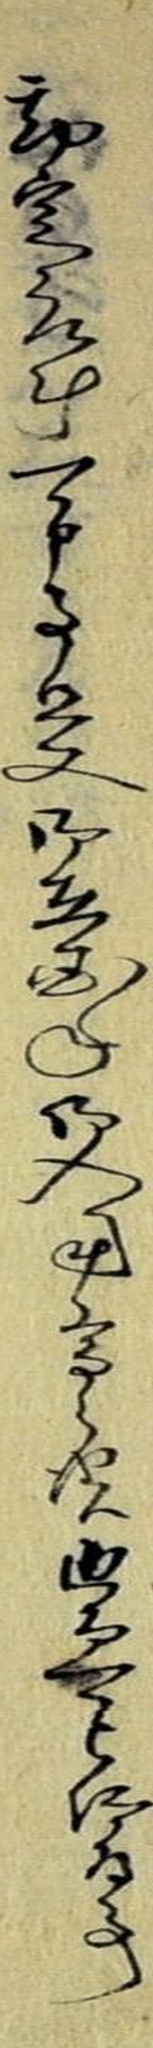勘定取斗可申事且又御在国年御入用高之儀は追而可被仰付候事
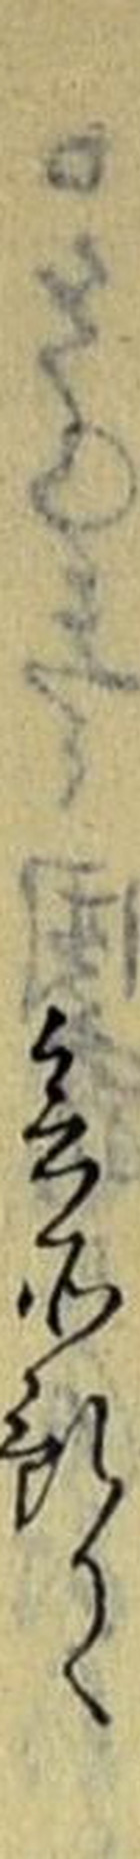会所預りへ
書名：命令之部 四
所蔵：福井県文書館 Fukui Prefectural Archives
